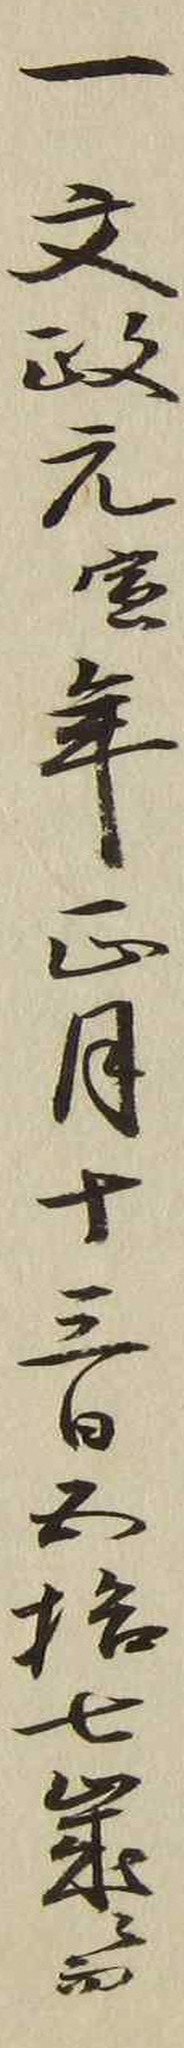一文政元寅年正月十三日五拾七歳ニ而

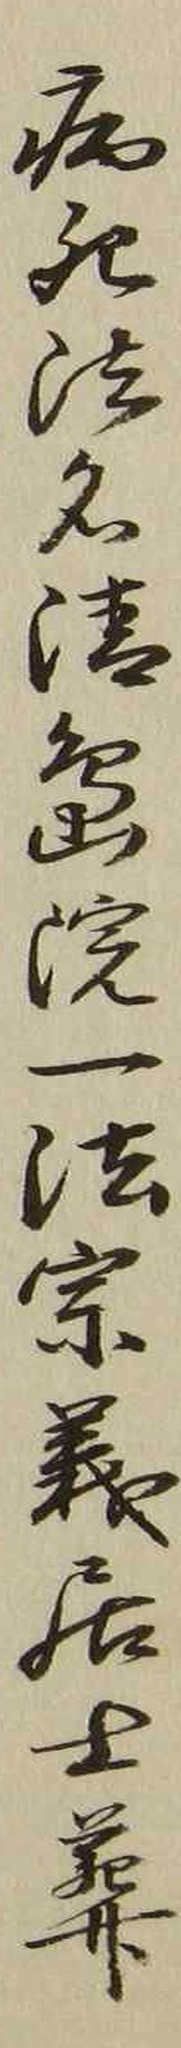病死法名清島院一法宗義居士葬
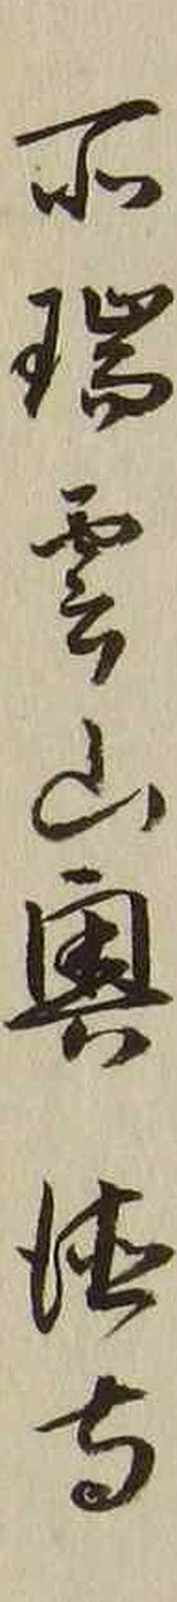所端雲山興徳寺
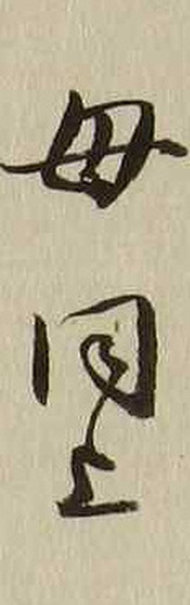母同上
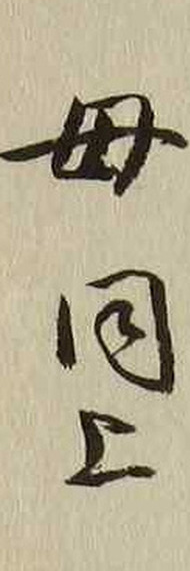母同上
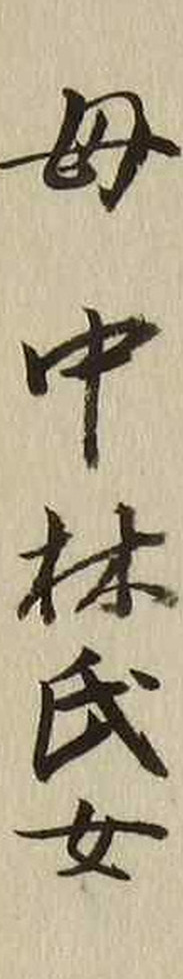母中林氏女
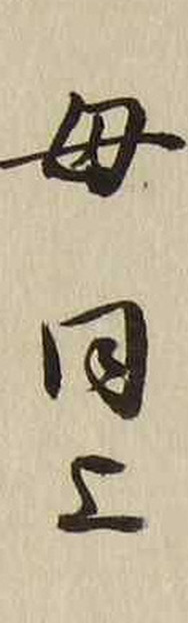母同上

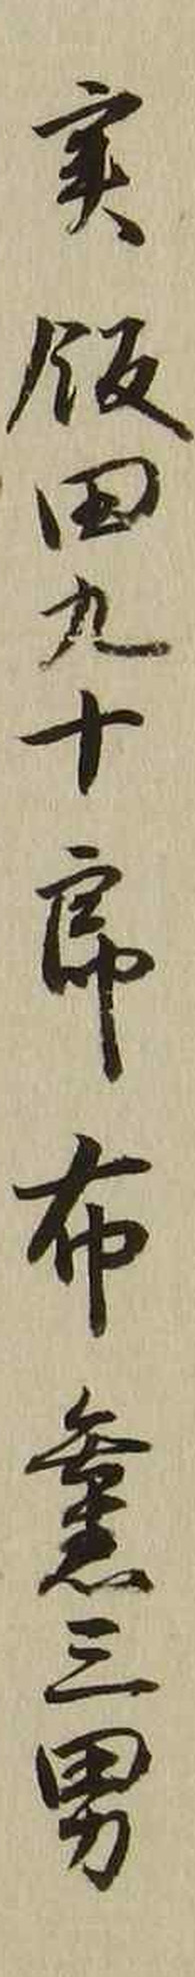実飯田九十郎布薫三男
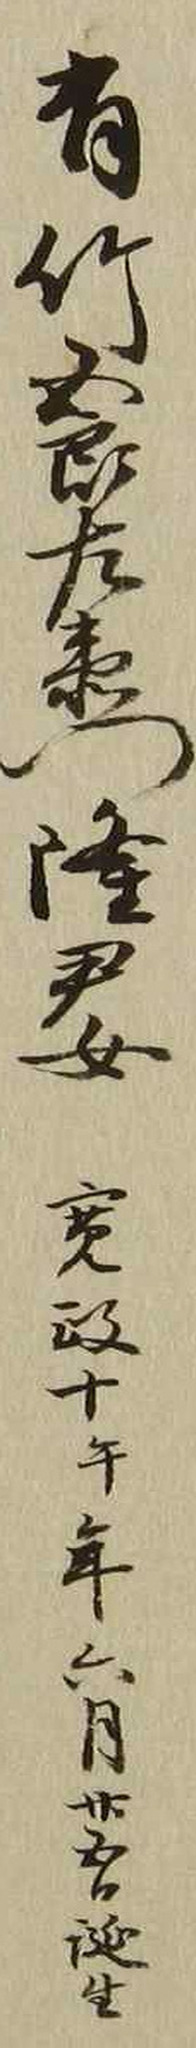有竹五郎左衛門隆尹女寛政十午年六月廿五日誕生
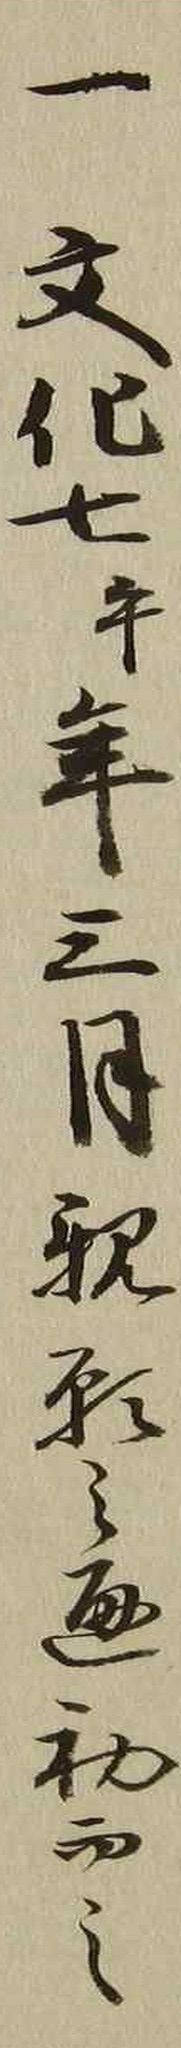一文化七午年三月親願之通初而之
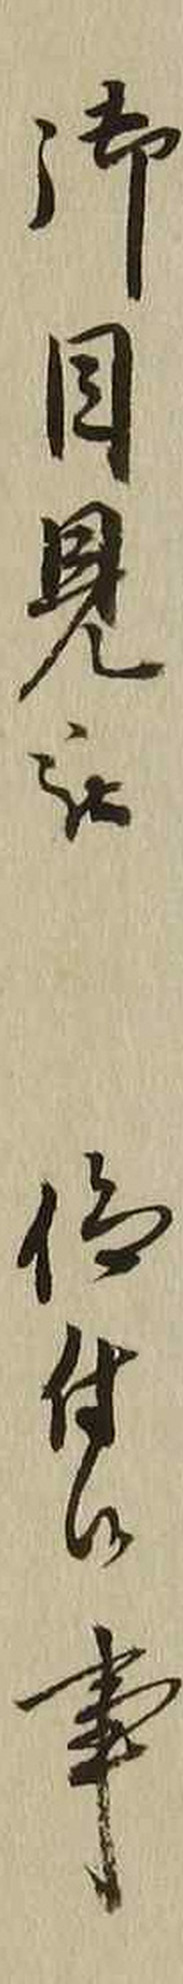御目見被仰付候事
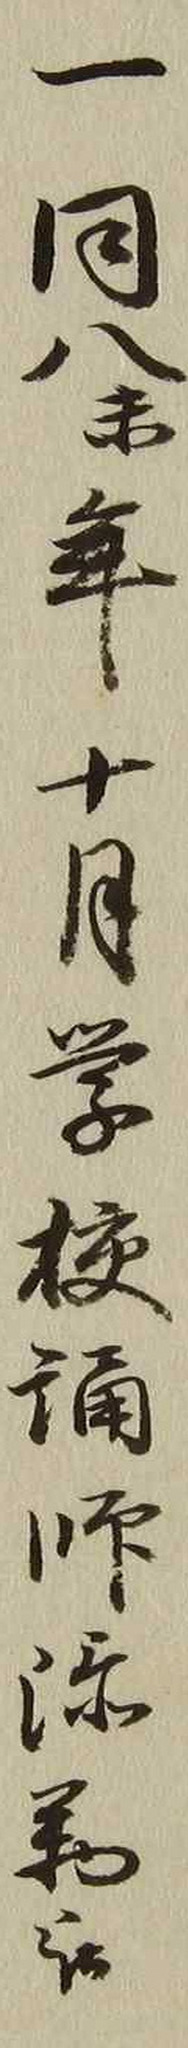一同八未年十月学校誦師添勤被
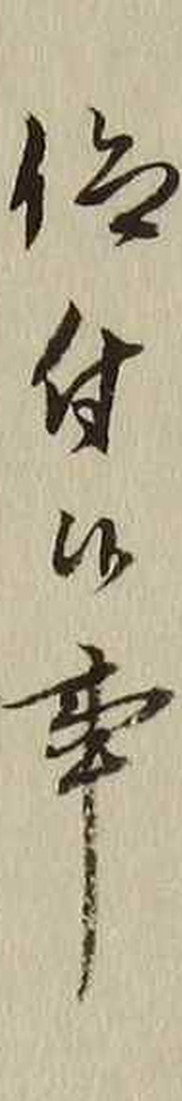仰付候事
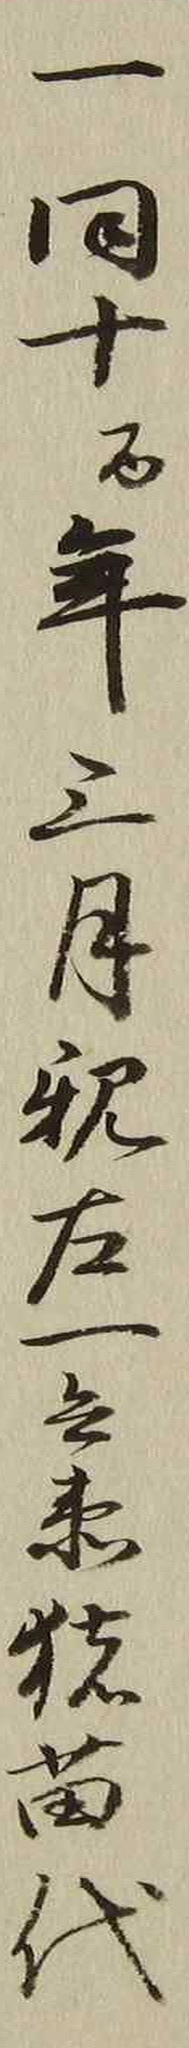一同十酉年三月親左一兵衛猪苗代
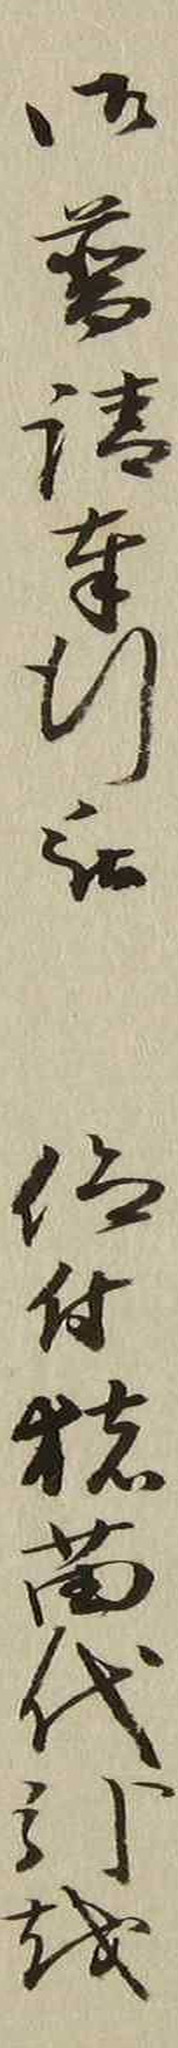御普請奉行被仰付猪苗代へ引越
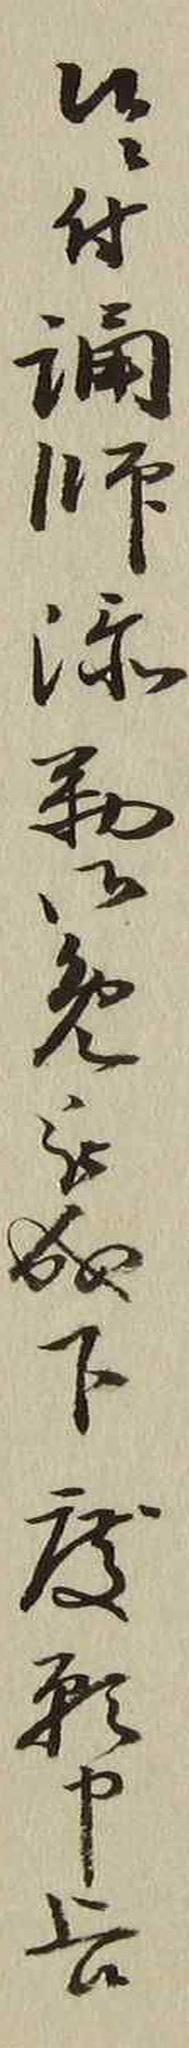候ニ付誦師添勤御免被成下度願申上候
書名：諸士系譜　巻之61　と之部4
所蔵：会津若松市立会津図書館
